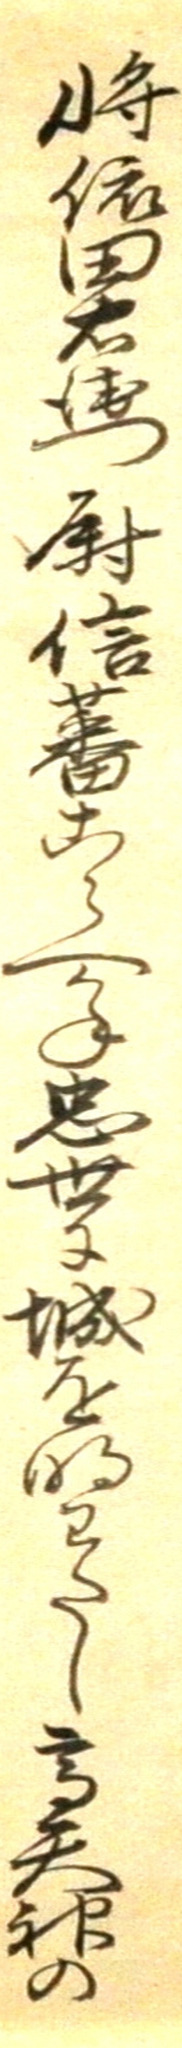将依田右衛門尉信蕃こらへかね忠世に城を明けわたし高天神の
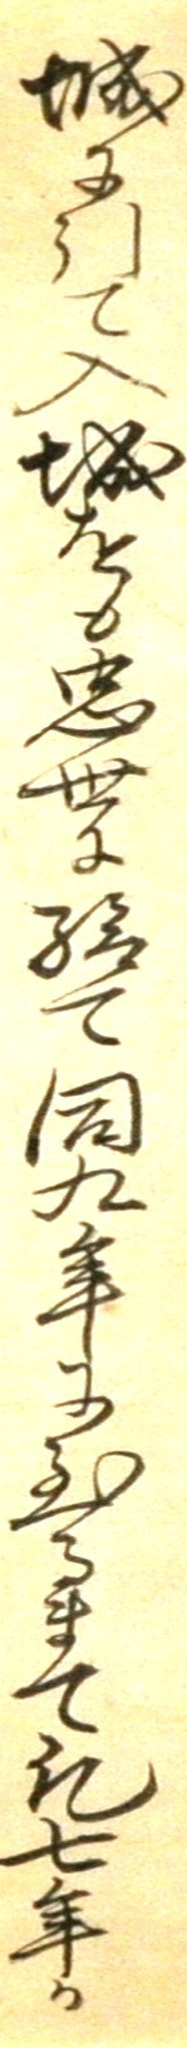城に引て入城をも忠世に給て同九年に至るまて凡七年か
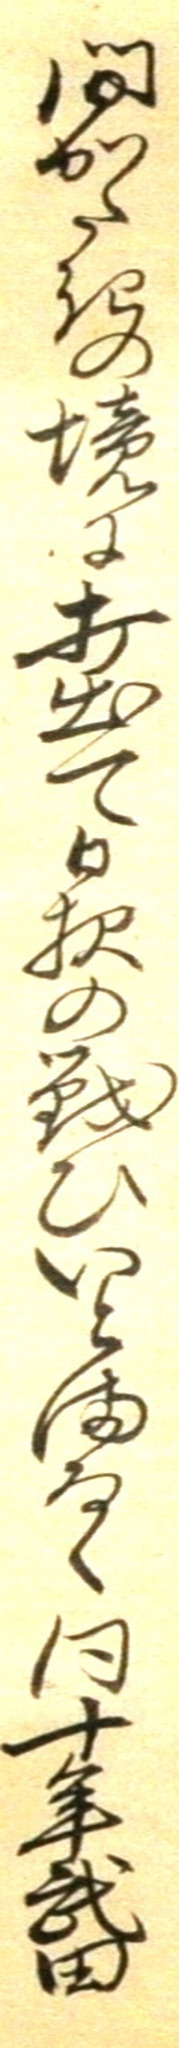間かたきの境に打出て日夜の戦ひいとまなく同十年武田
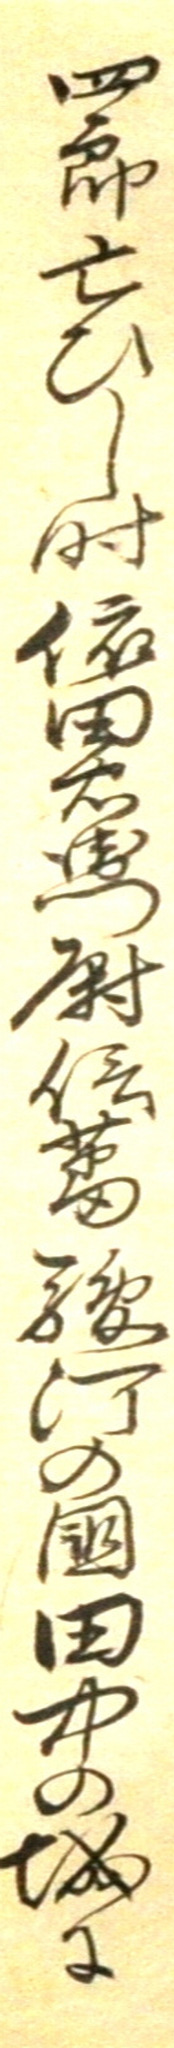四郎亡ひし時依田右衛門尉信蕃駿河の国田中の城に
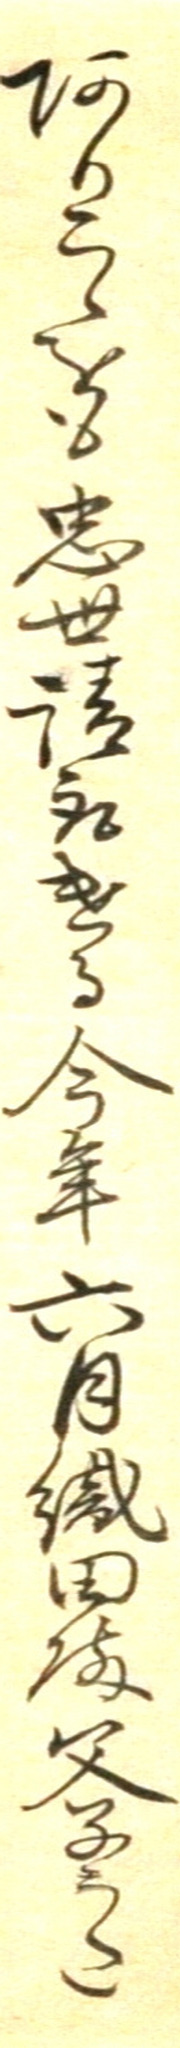ありこゝをも忠世請取ける今年六月織田殿父子うた
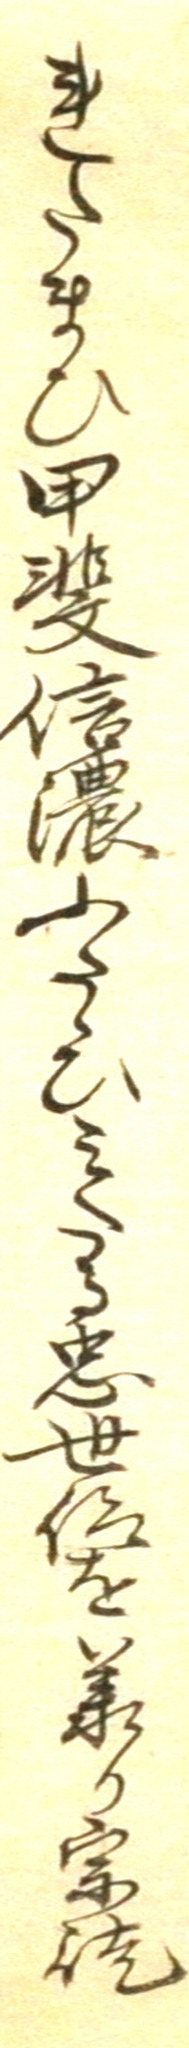れたまひ甲斐信濃ふたゝひみたる忠世仰を承り宗徒
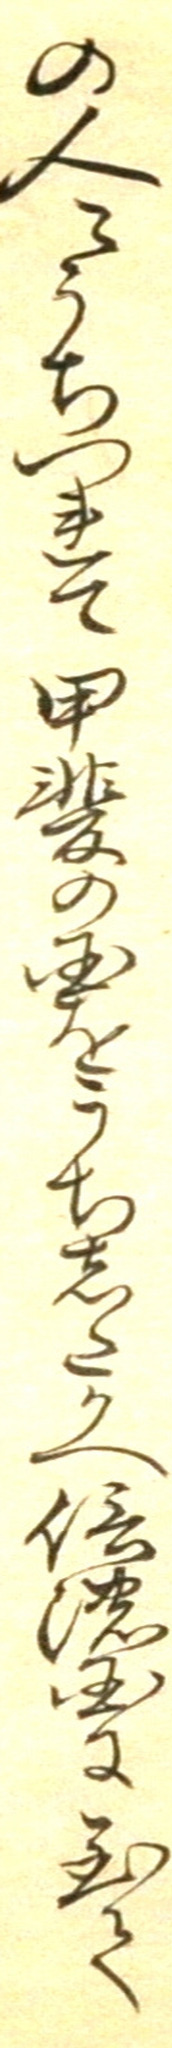の人々うちつれて甲斐の国をうちしたかへ信濃国に至て
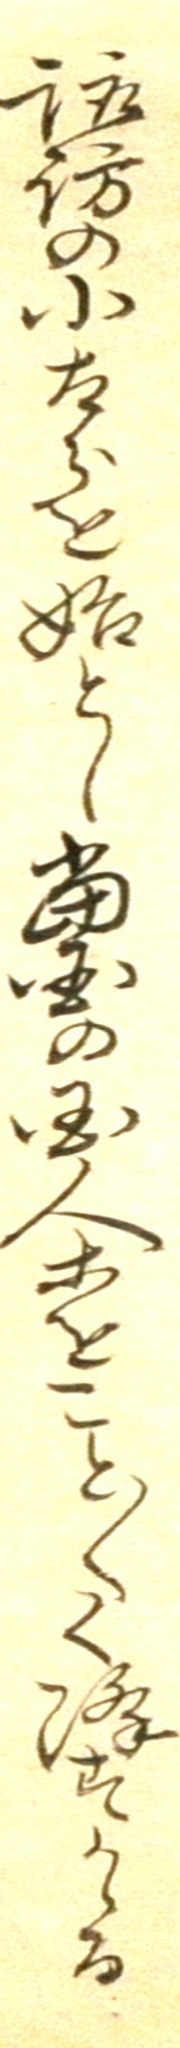諏訪の小太郎を始とし当国の国人等をこと〳〵く降すかゝる
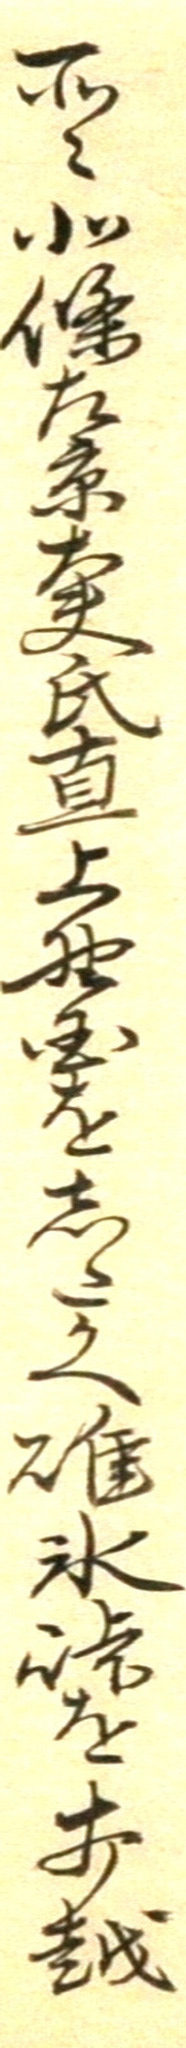所に北條左京大夫氏直上野国をしたかへ碓氷峠を打越
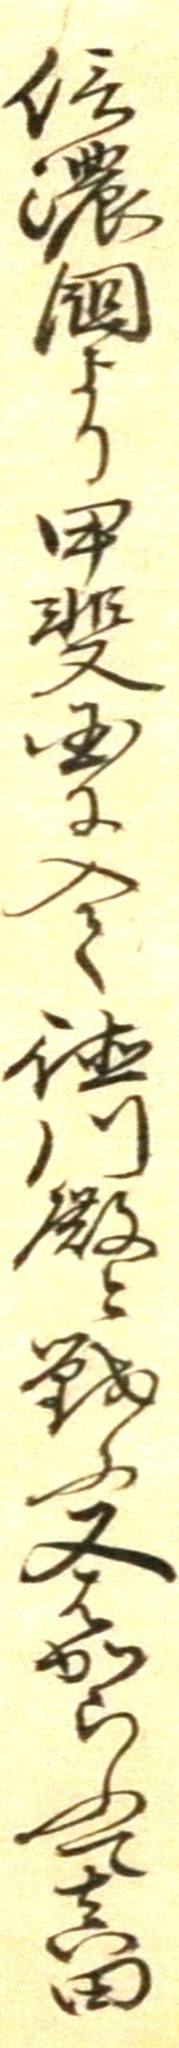信濃国より甲斐国に入て徳川殿と戦ふ又はからふて真田
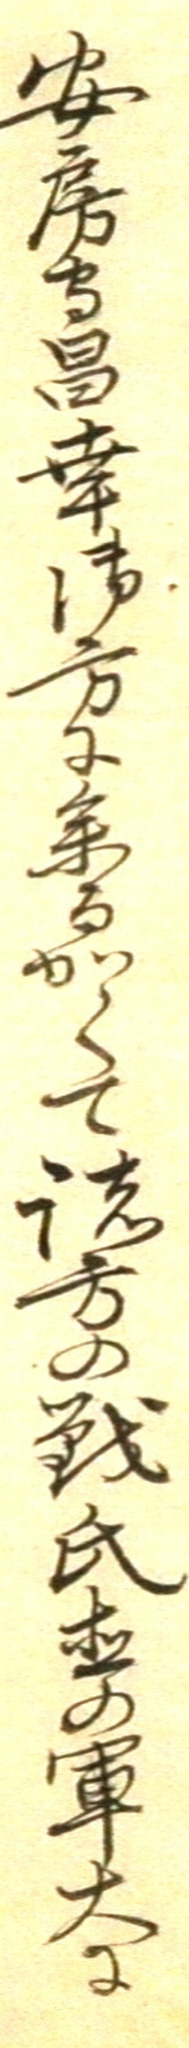安房守昌幸御方に参るかくて諸方の戦氏直の軍大に
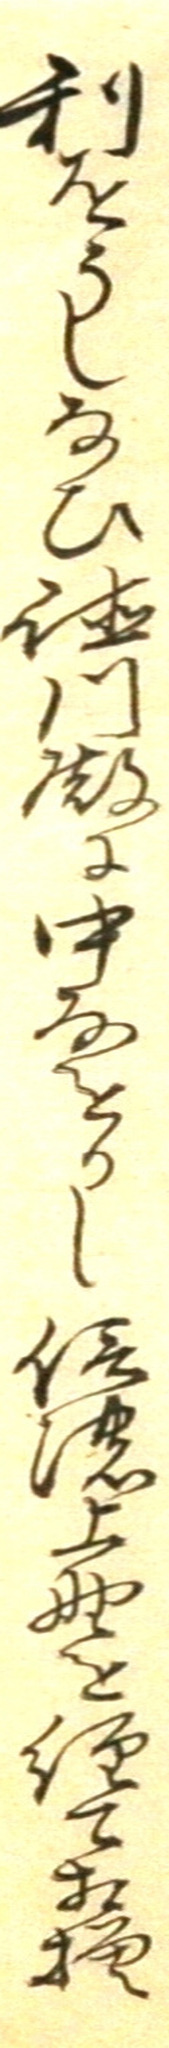利をうしなひ徳川殿に中なをりし信濃上野を経て相模
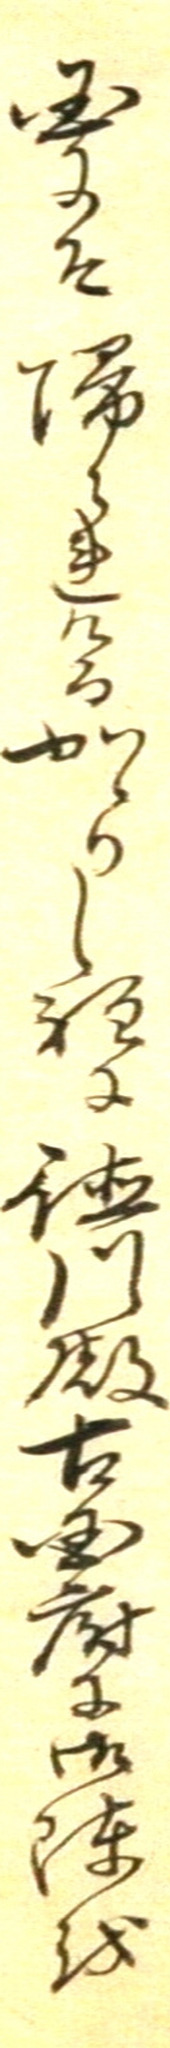国にそ帰られけるかゝりし程に徳川殿古国府に御陣を
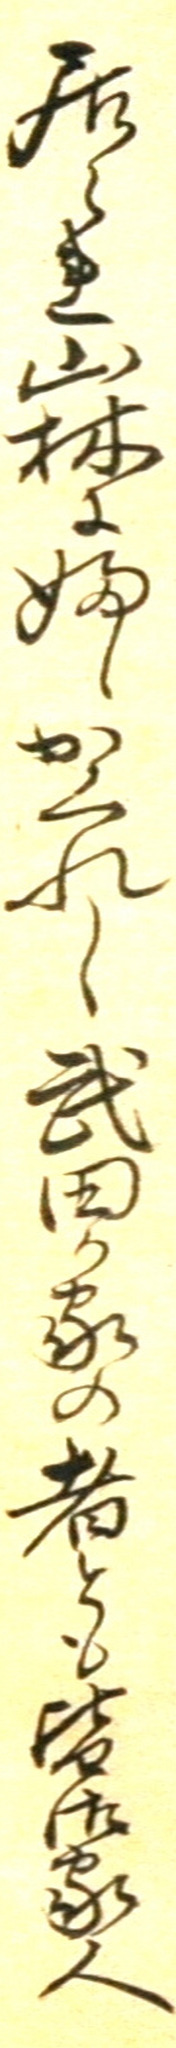居られ山林にふしかくれし武田か家の者とも皆御家人

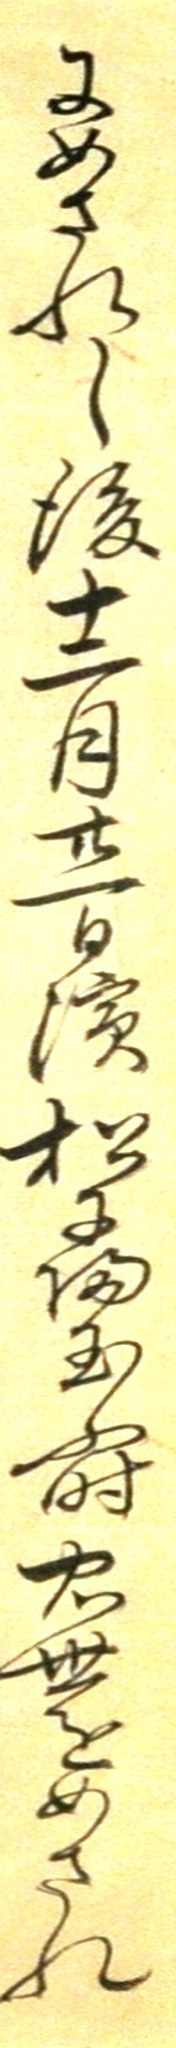にめされし後十二月二十一日浜松に帰玉ふ時忠世をめされ
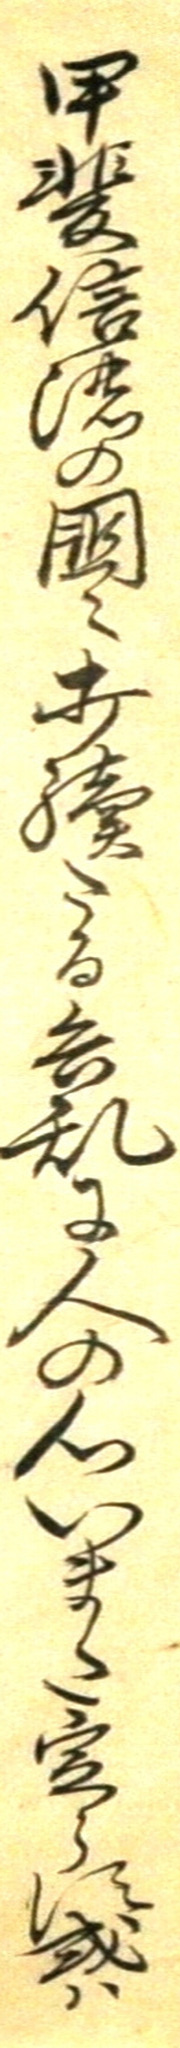甲斐信濃の国々打続たる兵乱に人の心いまた定まらす或は
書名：藩翰譜（四・中）
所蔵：伊那市立高遠町図書館・合同会社AMANE
